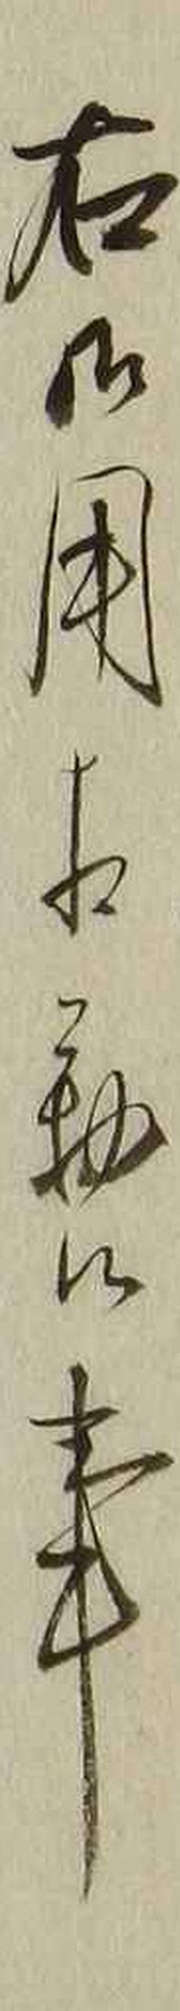右御用相勤候事
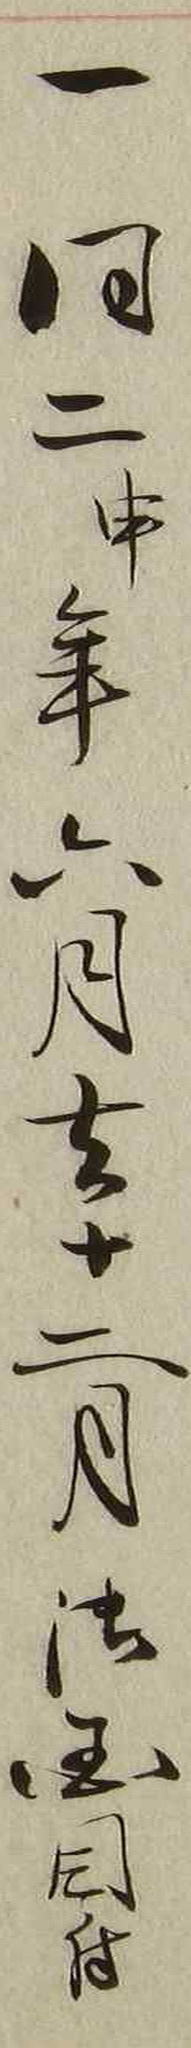一同二申年六月去十二月御国目付
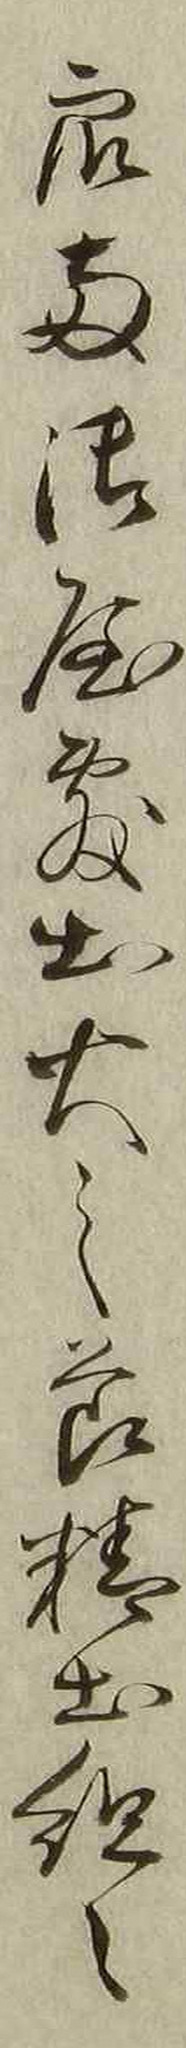衆両御屋敷出火之節精出組之
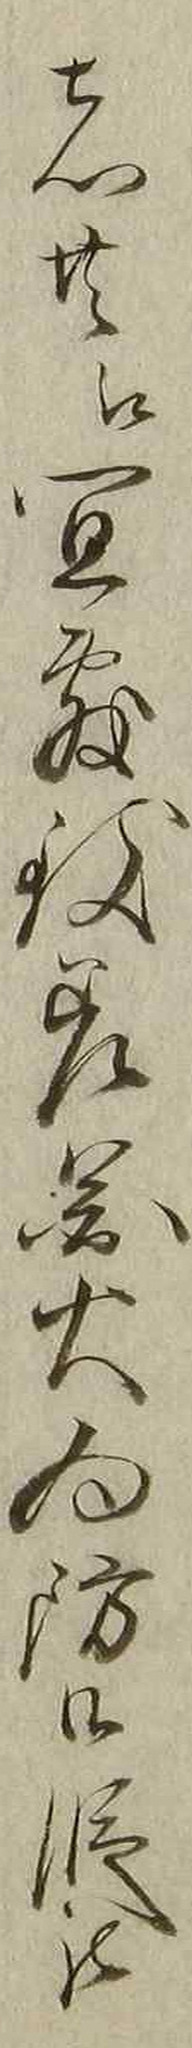者共江宜敷致差図火為防候段被
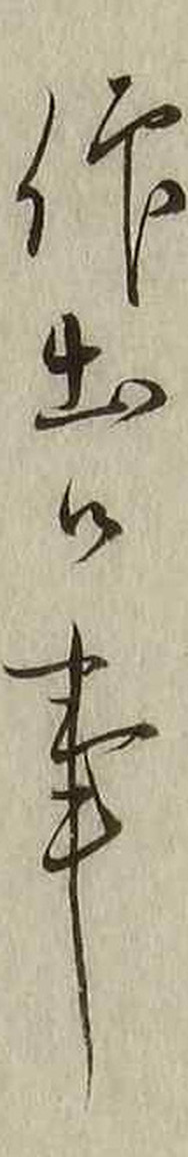仰出候事
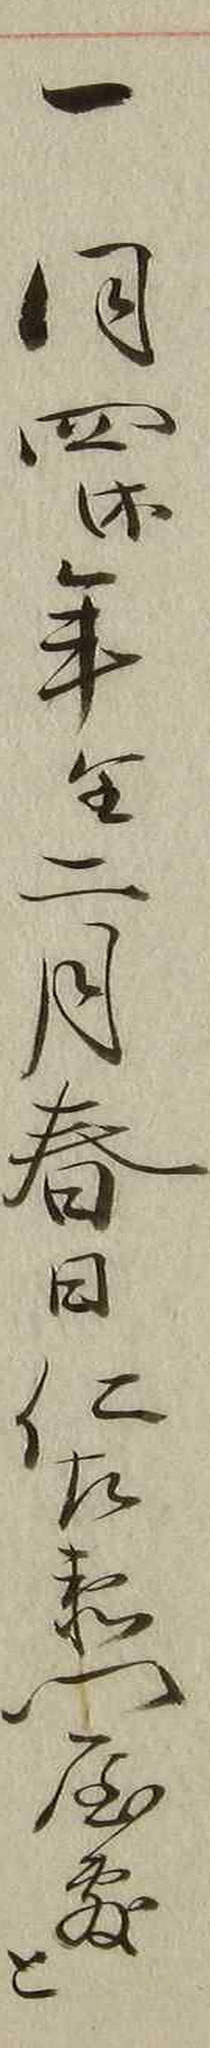一同四戌年閏二月春日仁左衛門屋敷と
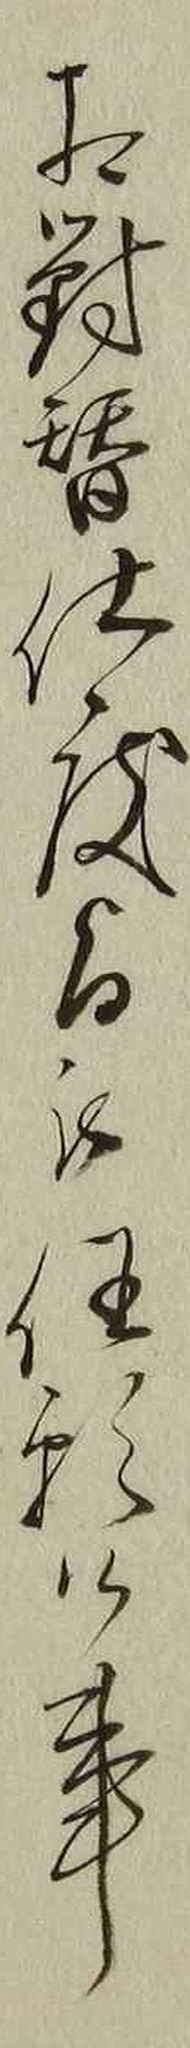相対替仕度旨被任願候事
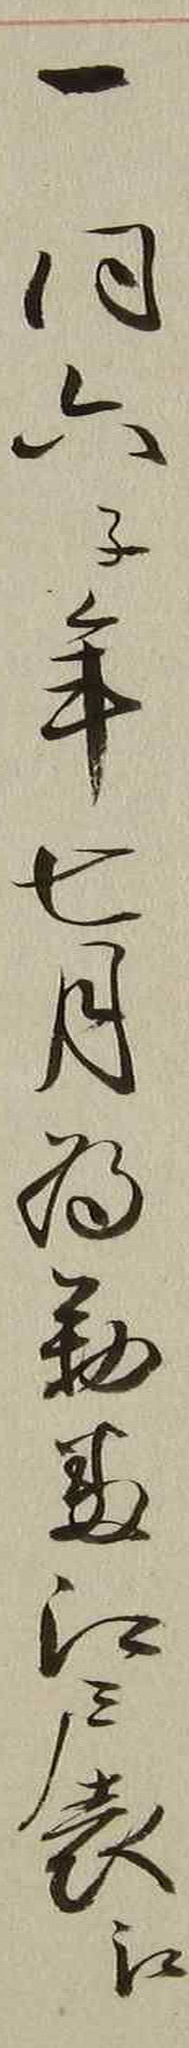一同六子年七月為勤番江戸表江
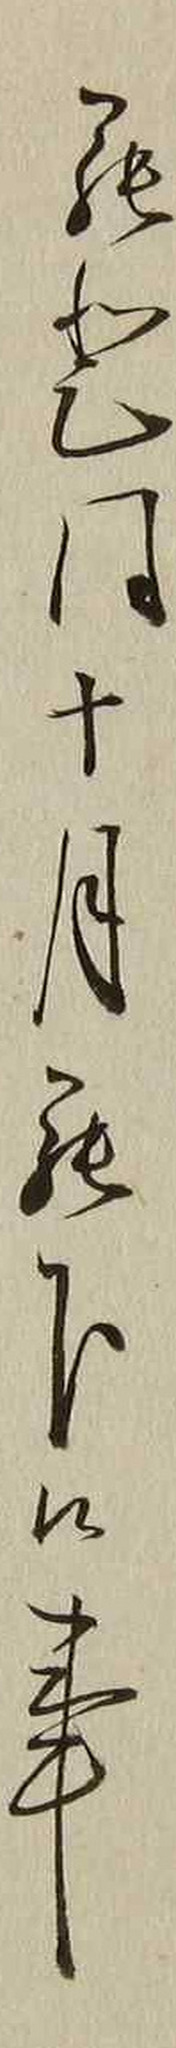罷登同十月罷下候事
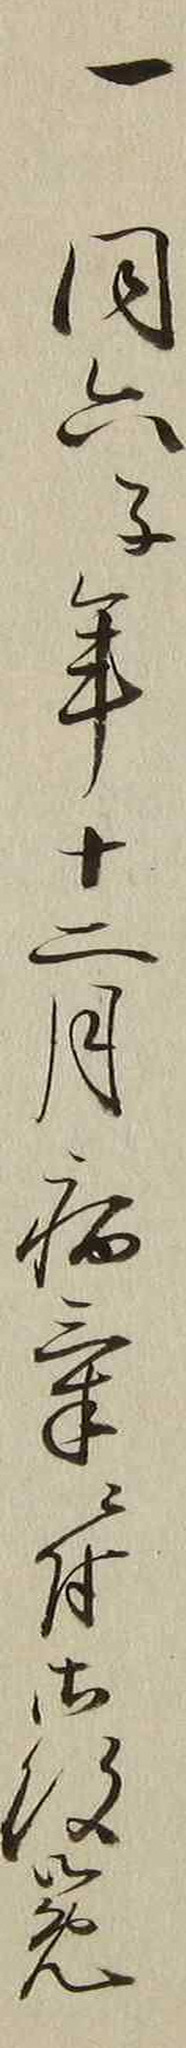一同六子年十二月病気に付御役御免
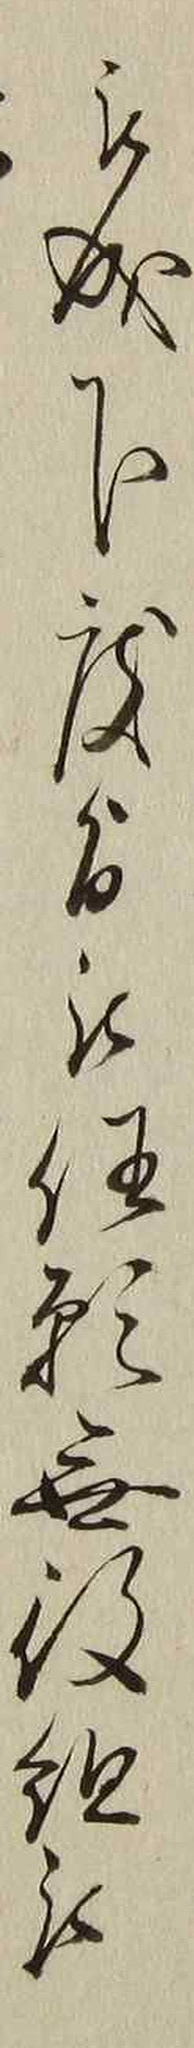被成下度旨被任願無役組被
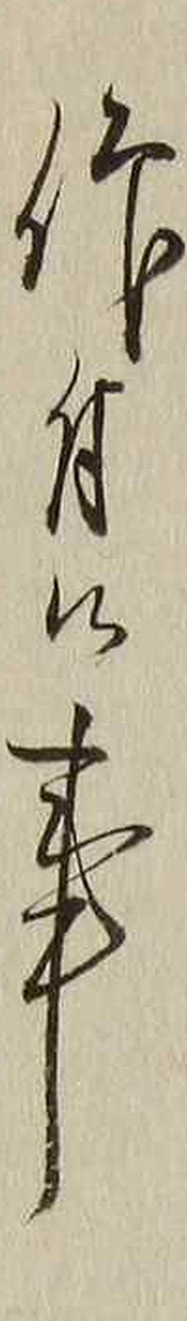仰付候事
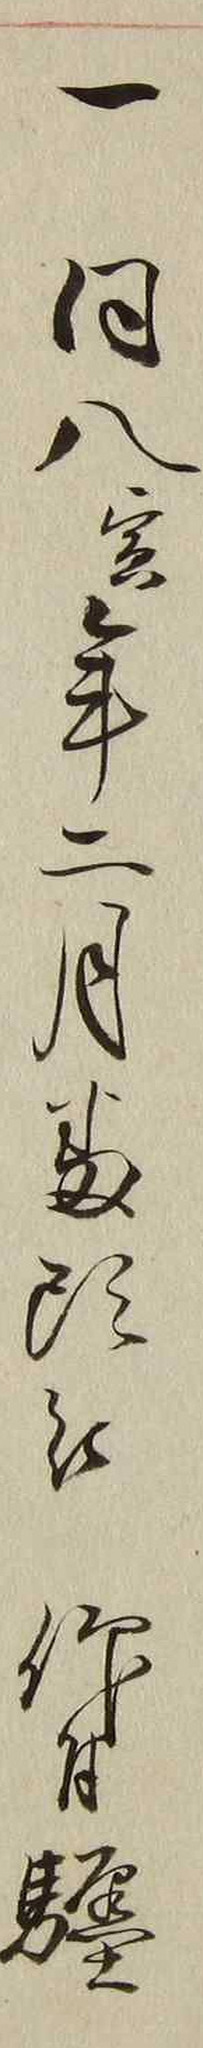一同八寅年二月番頭被仰付
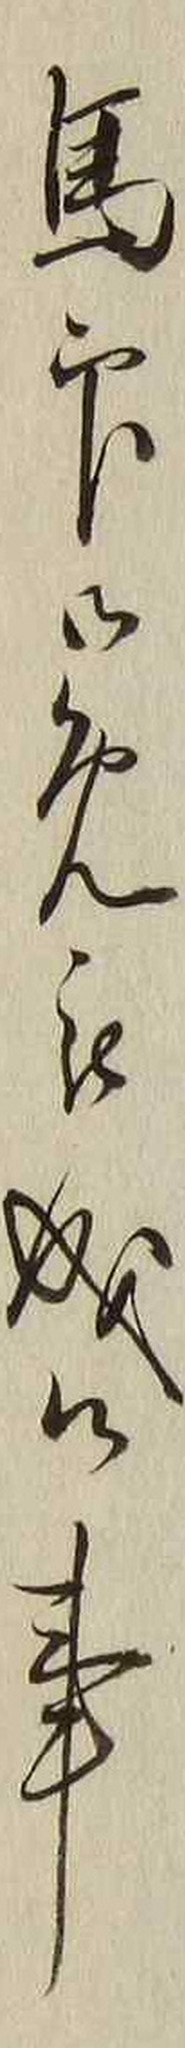馬印御免被成候事
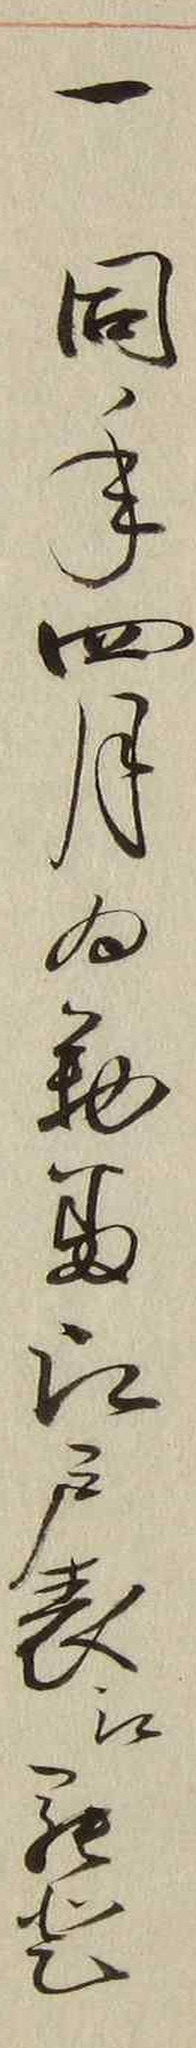一同年四月為勤番江戸表江罷登
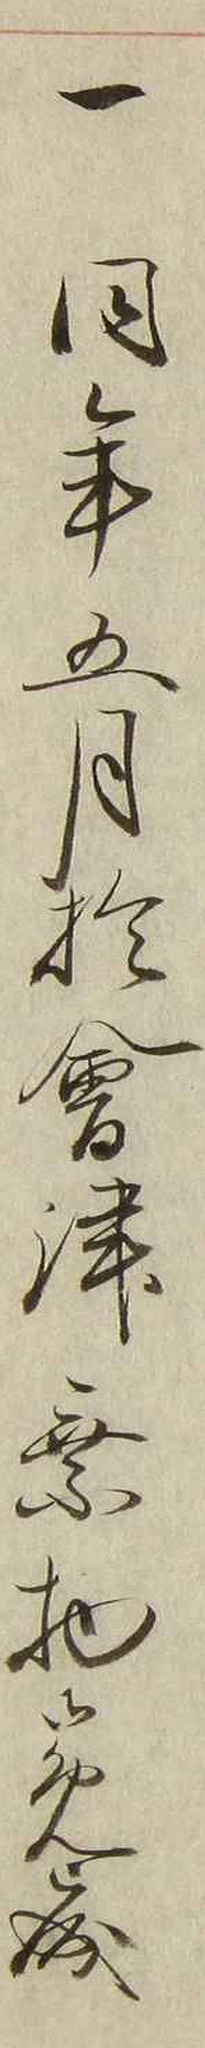一同年五月於会津乗物御免被成
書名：諸士系譜　巻之103　か之部11
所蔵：会津若松市立会津図書館
